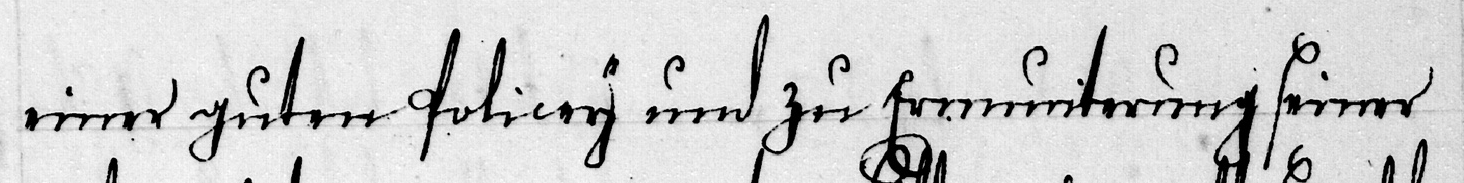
einer guten Policey und zu Ermunterung seiner
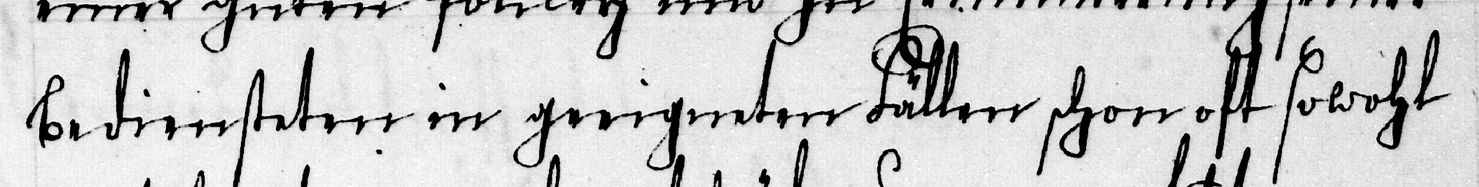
Bediensteten in geeigneten Fällen schon oft sowohl
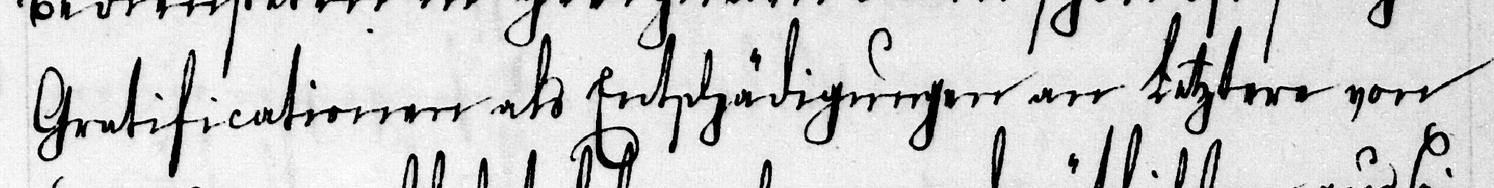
Gratificationen als Entschädigungen an Letztere von
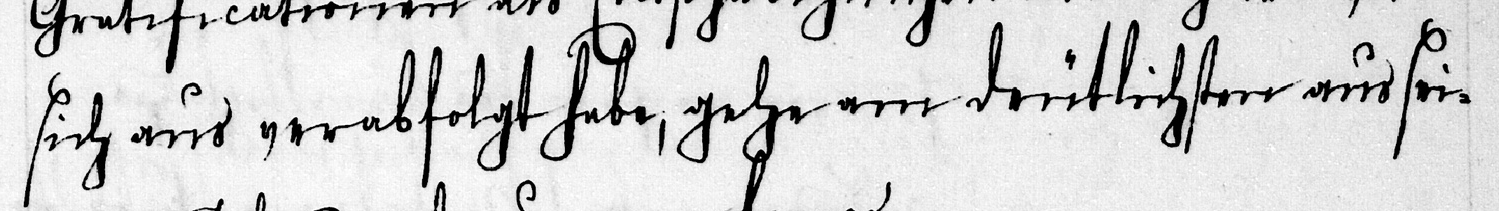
sich aus verabfolgt habe, gehe am deutlichsten aus sei¬
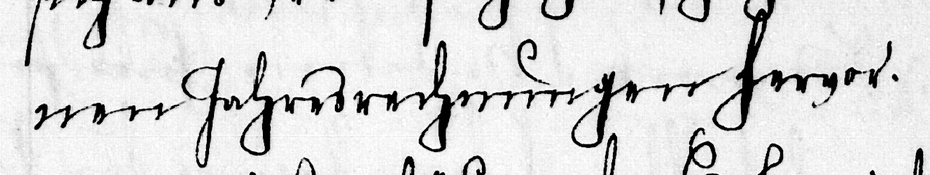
nen Jahresrechnungen hervor.
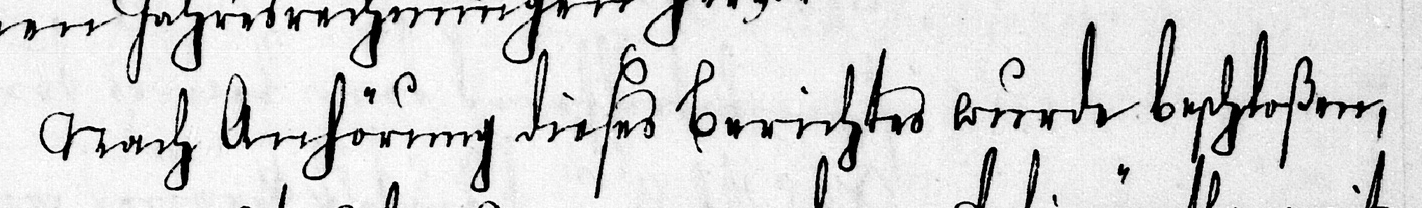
Nach Anhörung dieses Berichtes wurde beschloßen,
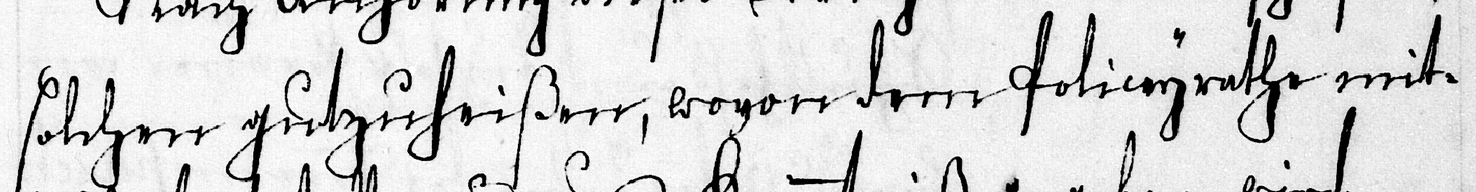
solchen gutzuheißen, wovon dem Policeyrathe mit¬
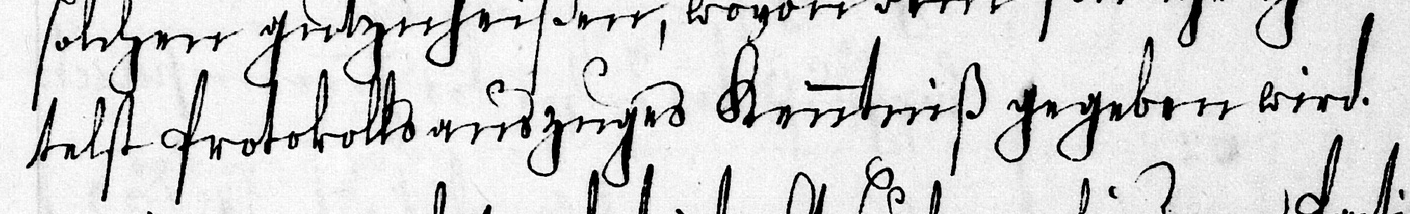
telst Protokollsauszuges Kenntniß gegeben wird.
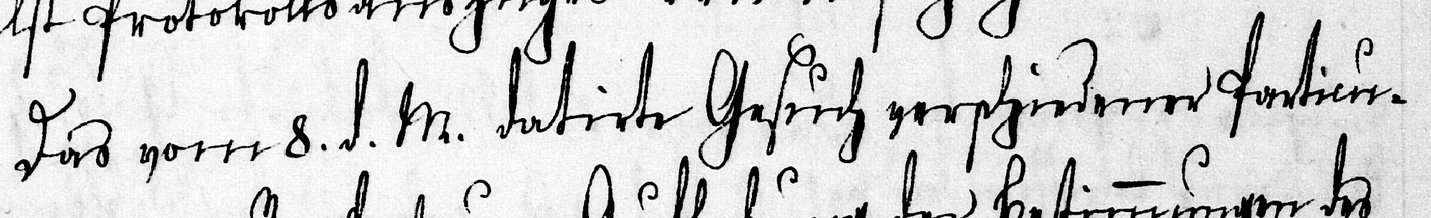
Das vom 8. d. M. datirte Gesuch verschiedener Particu¬
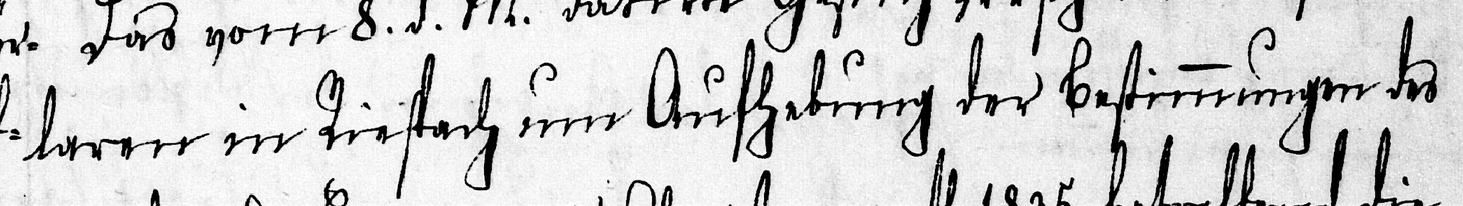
laren in Riespach um Aufhebung der Bestimmungen des
